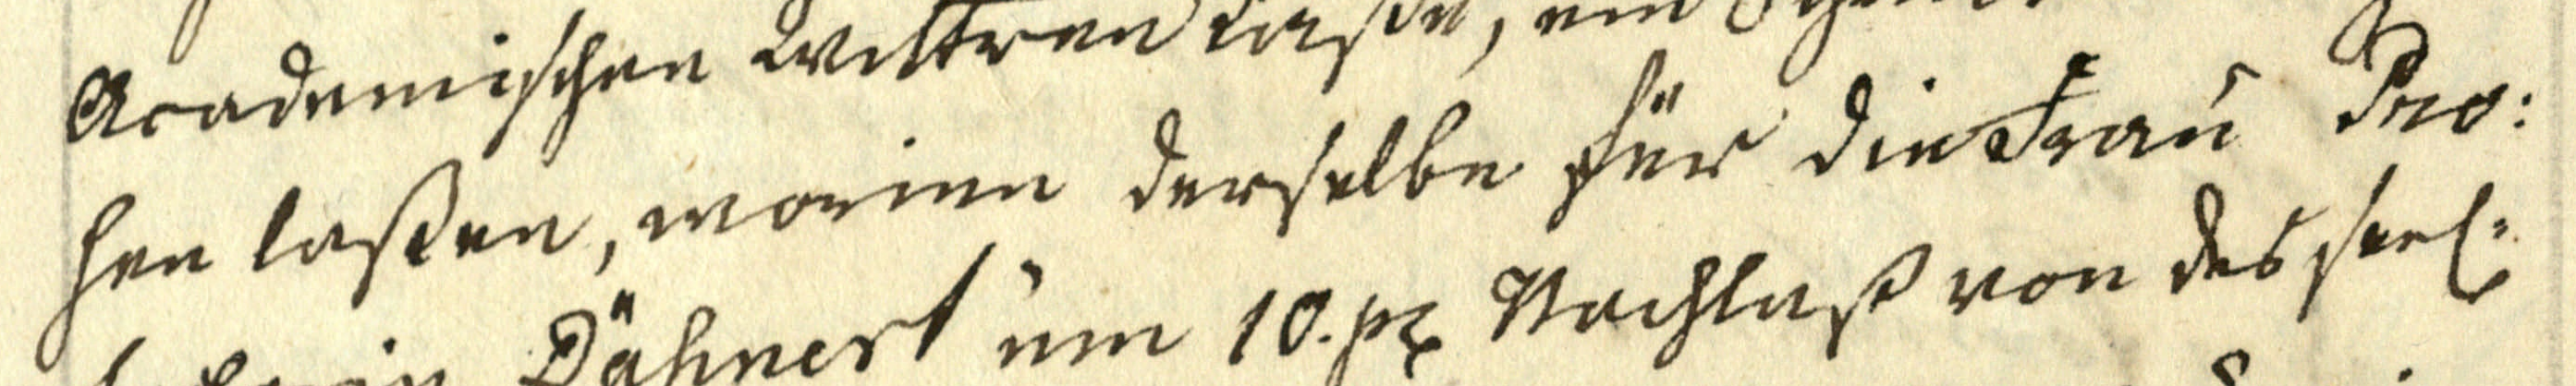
hen laßen, worin derselbe für die Frau Pro¬
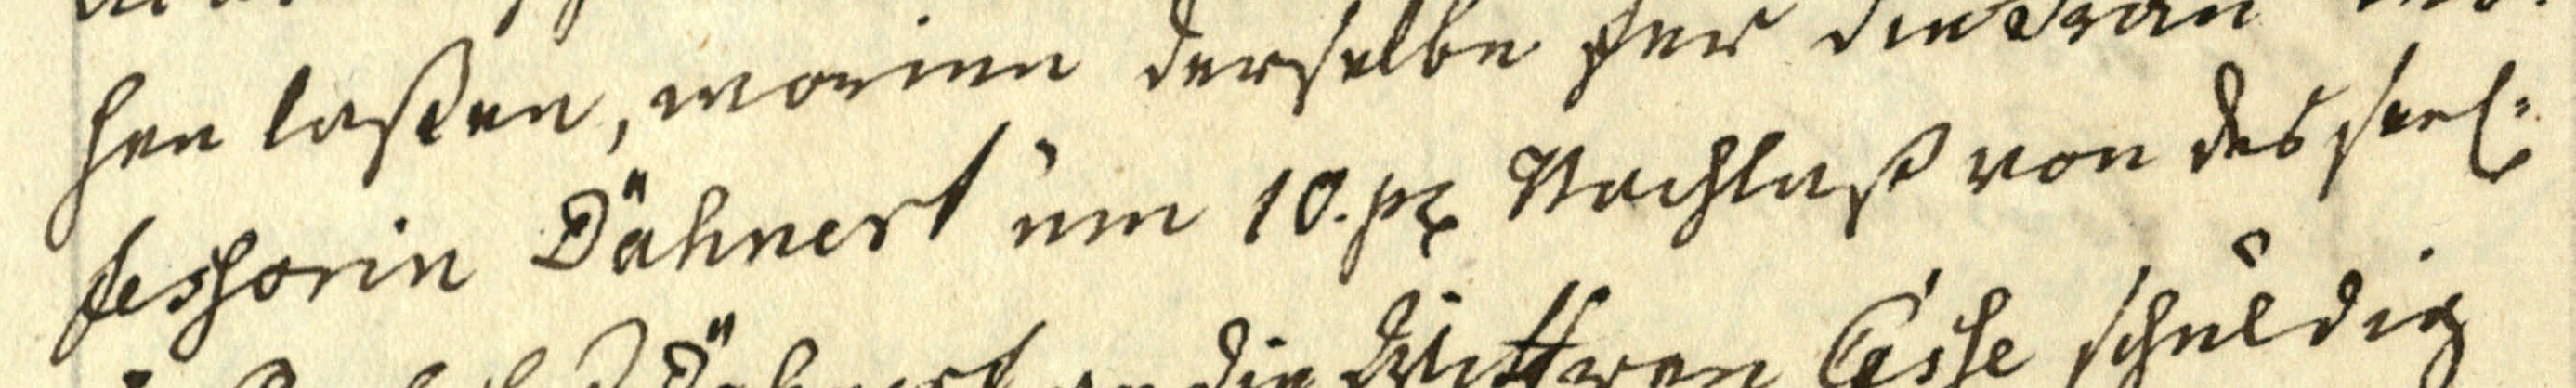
fessorin Dähnert um 10. p Nachlaß von des seel.
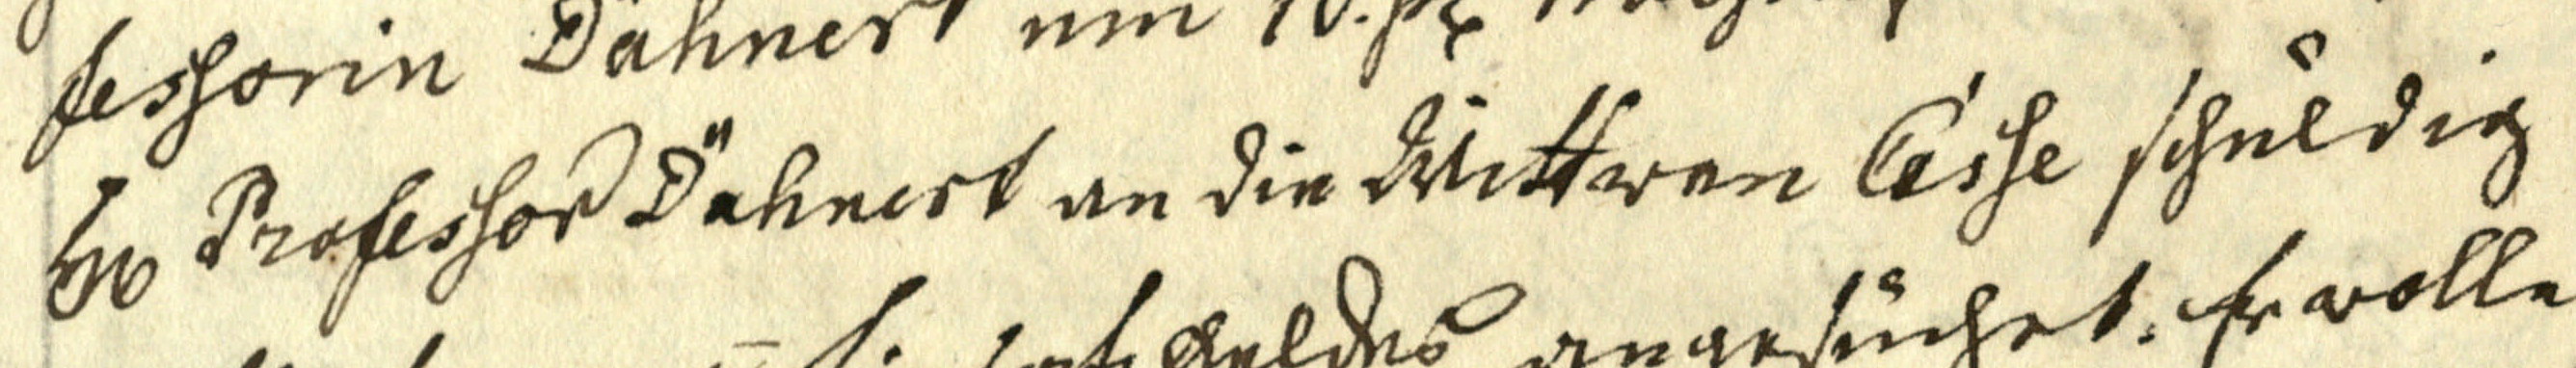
H Professor Dähnert an die Wittwen Casse schuldig
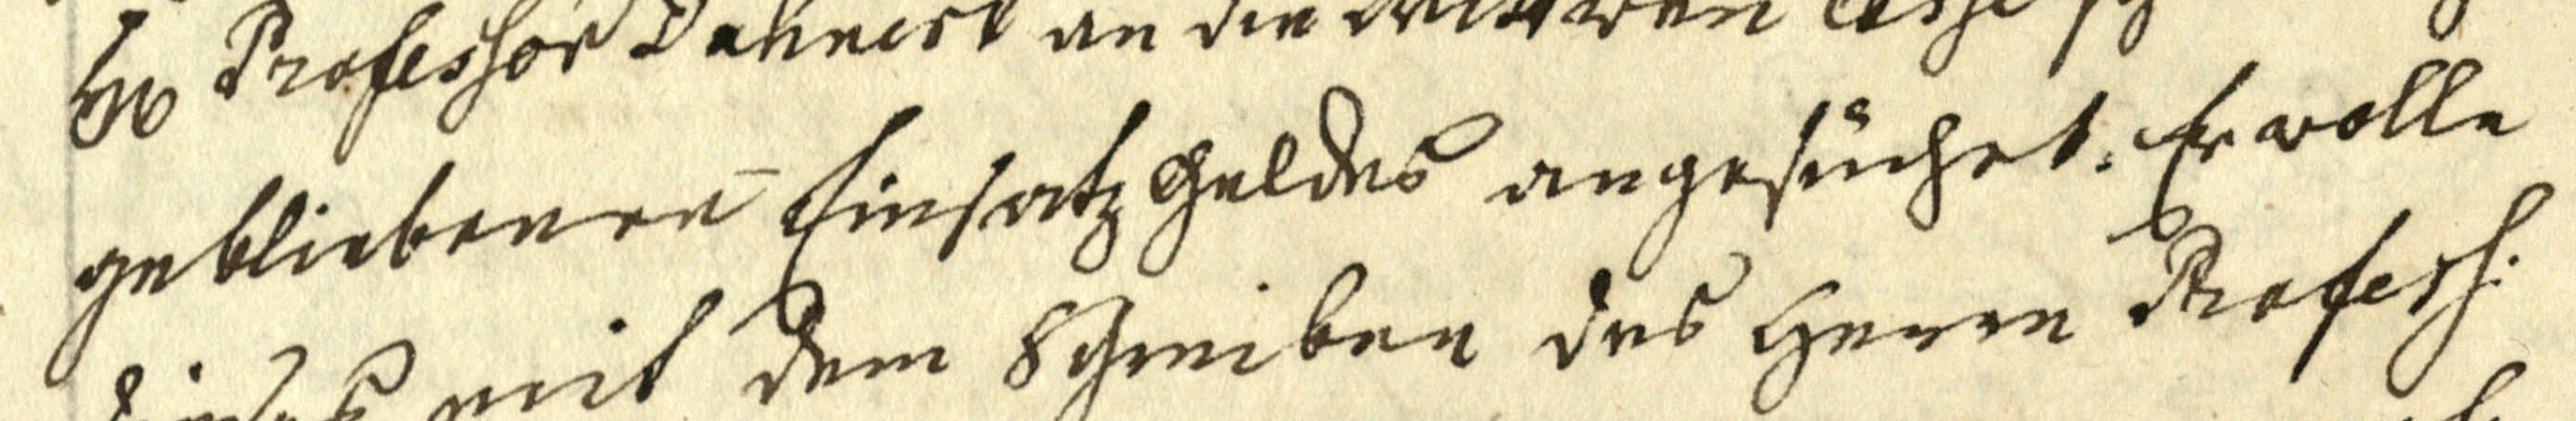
gebliebene Einsatz Geldes angesuchet. Er wolle
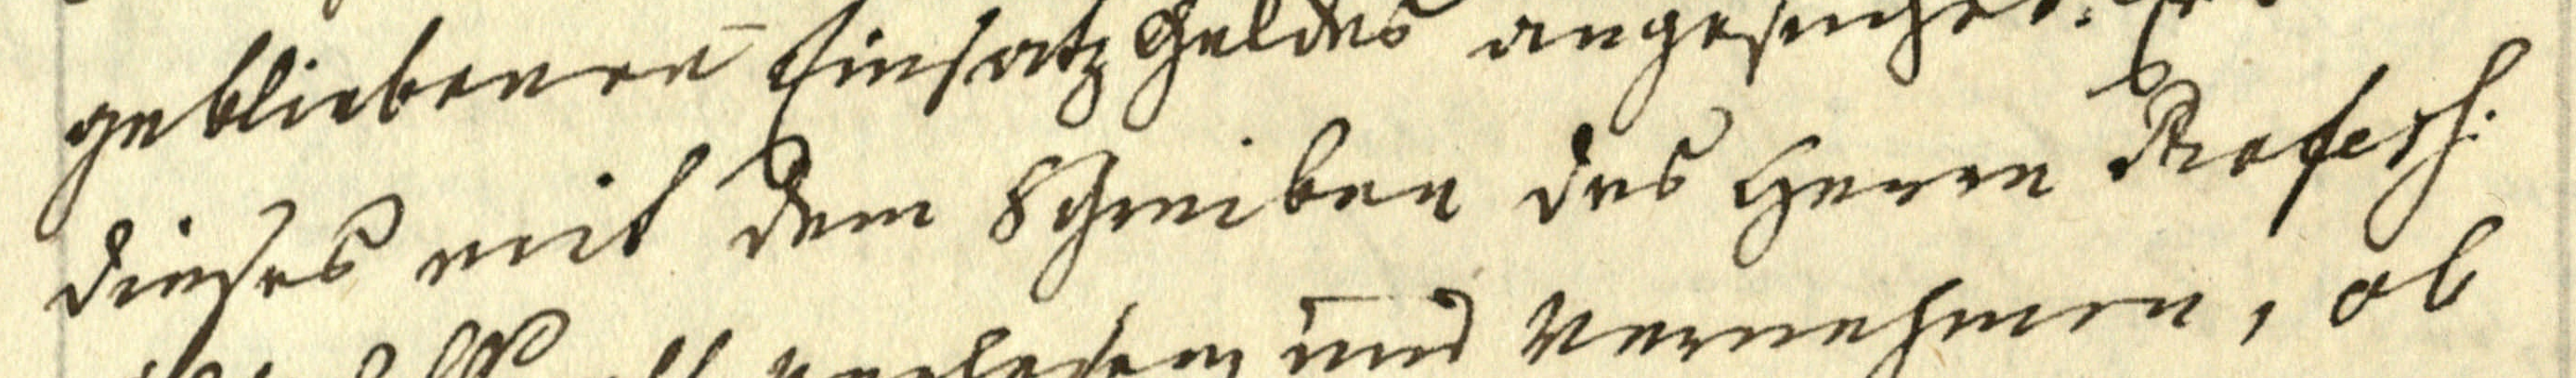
dieses mit dem Schreiben des Herrn Profess.
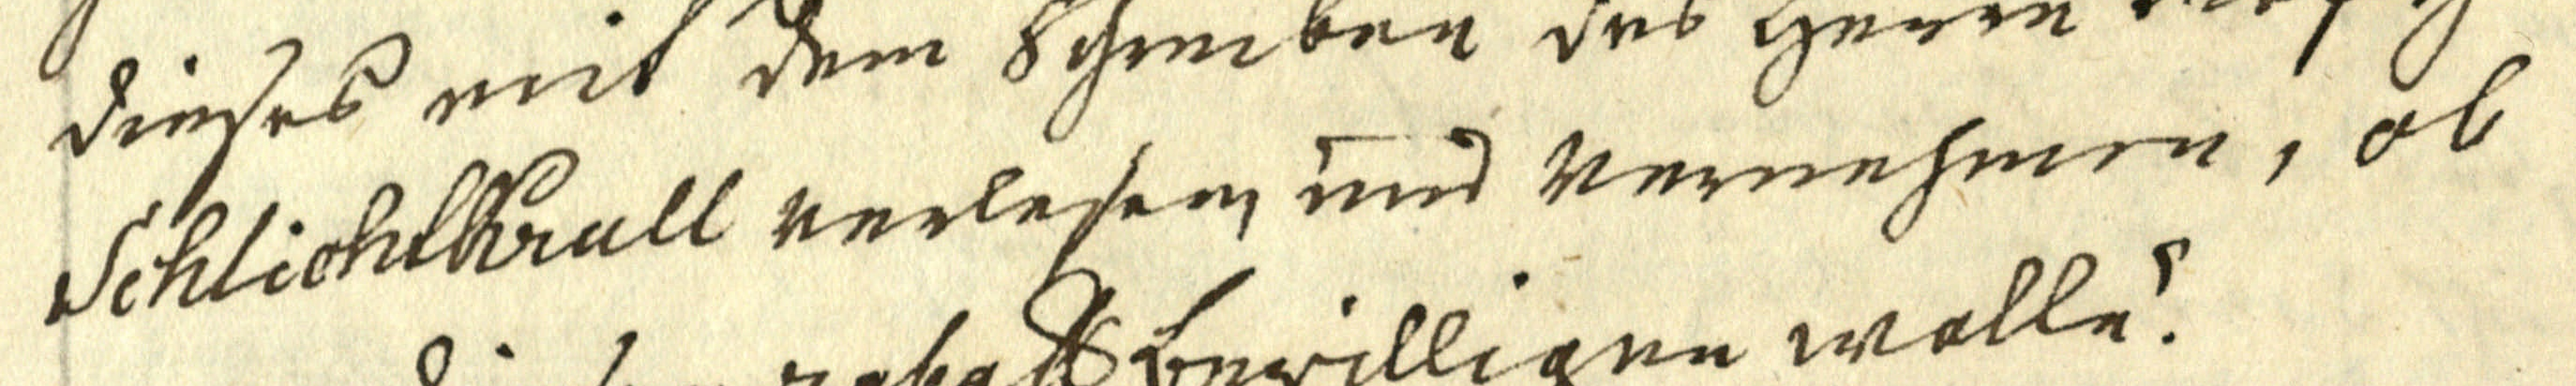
Schlichtkrull verlesen, und vernehmen, ob
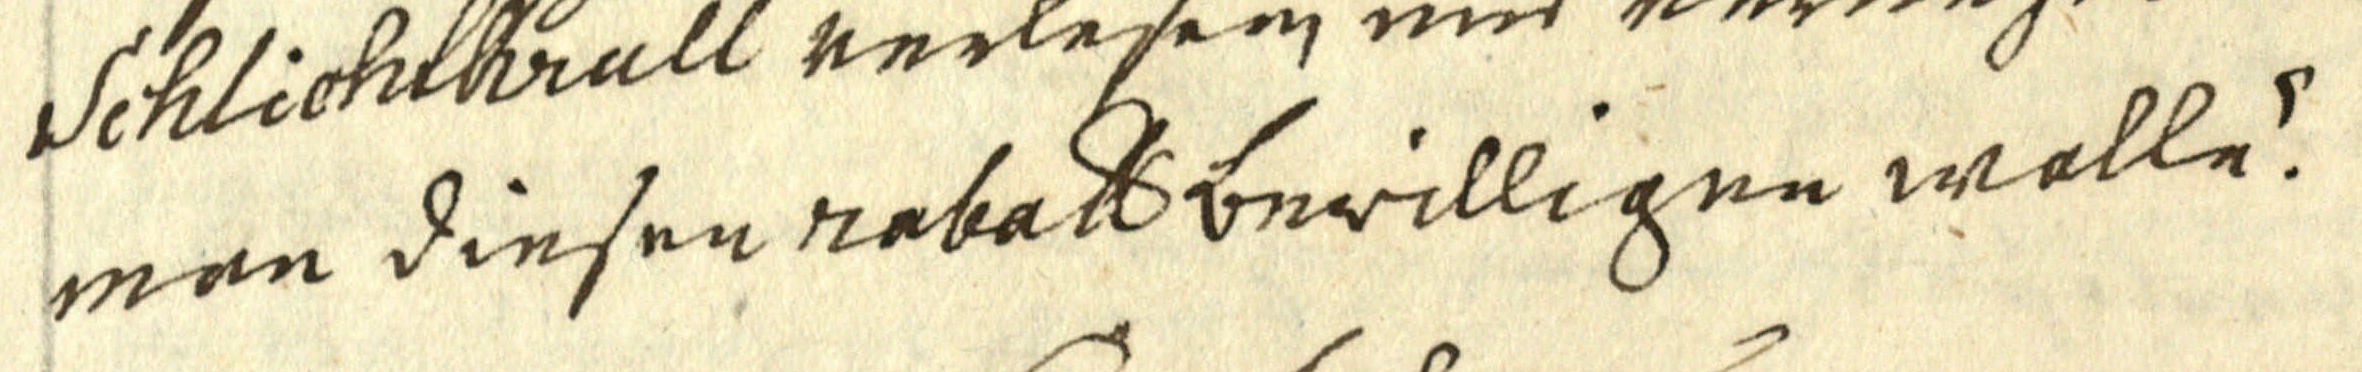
man diesen rabatt bewilligen wolle?
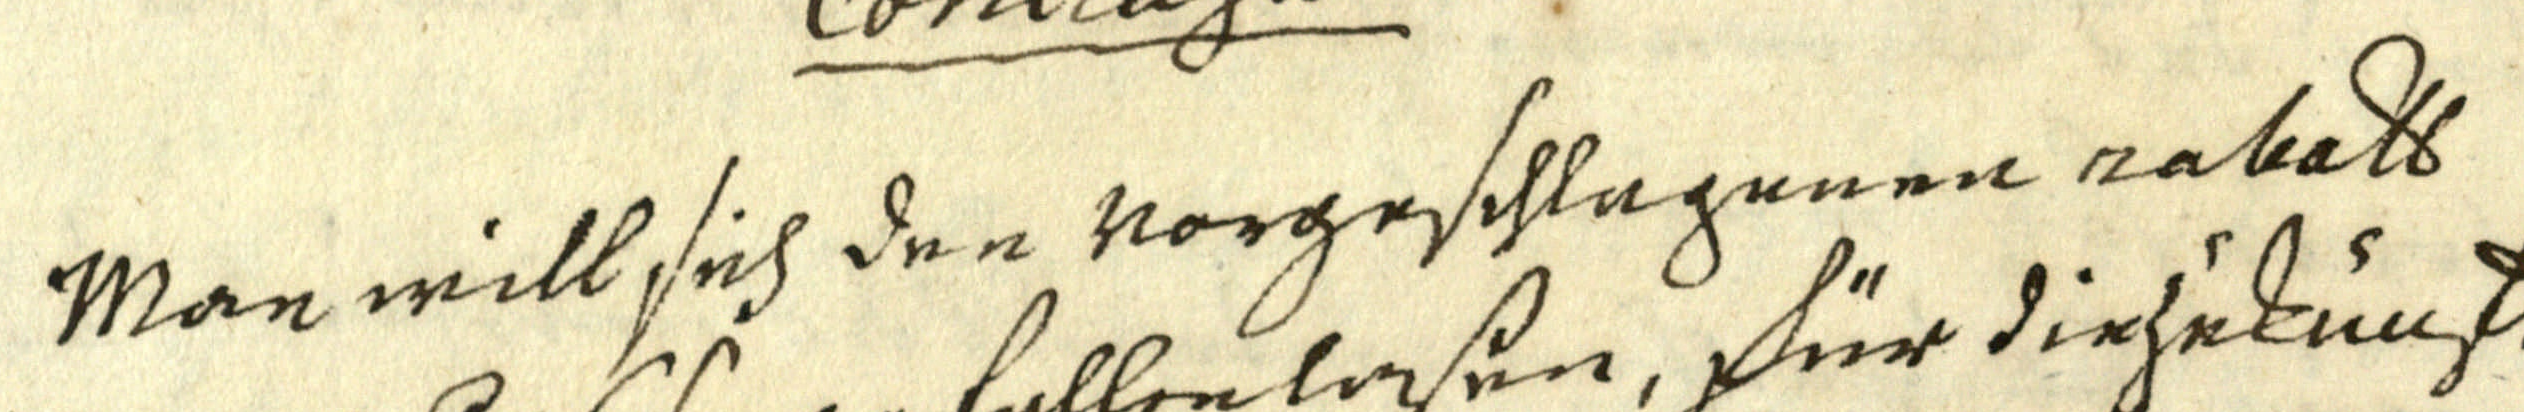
Man will sich den vorgeschlagenen rabatt
